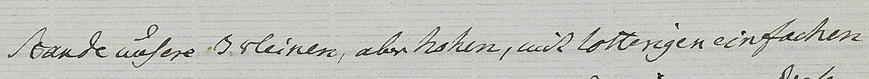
Stande unsere 3 kleinen, aber hohen, mit lotterigen einfachen
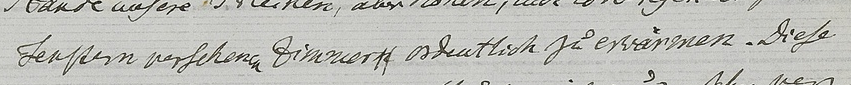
Fenstern versehenen Zimmern ordentlich zu erwärmen. Diese
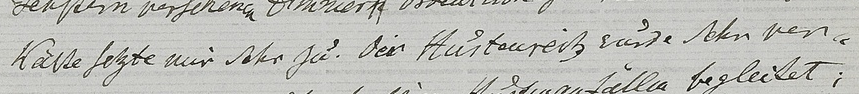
Kälte setzte mir sehr zu. Der Hustenreitz wurde sehr ver-
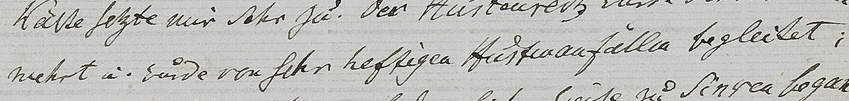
mehrt u. wurde von sehr heftigen Hustenanfällen begleitet;
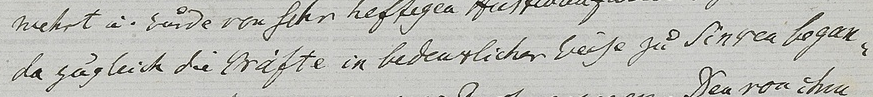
da zugleich die Kräfte in bedenklicher Weise zu sinken began-
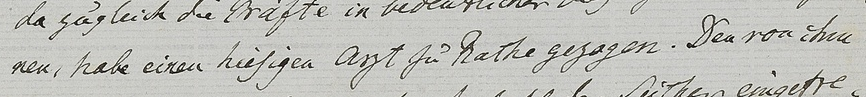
nen, habe einen hiesigen Arzt zu Rathe gezogen. Den von ihm
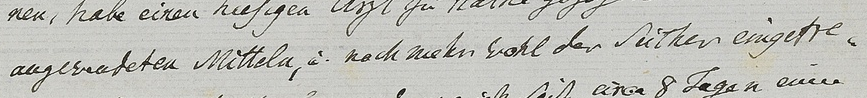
angeordneten Mitteln, u. noch mehr wohl der seither eingetre-
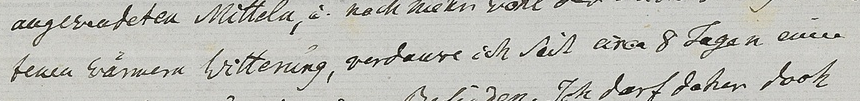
tenen wärmern Witterung, verdanke ich seit circa 8 Tagen eine
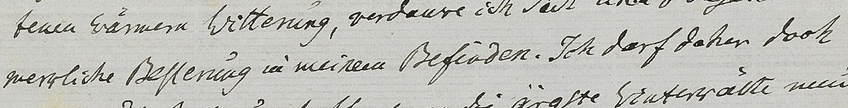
merkliche Besserung in meinem Befinden. Ich darf daher doch
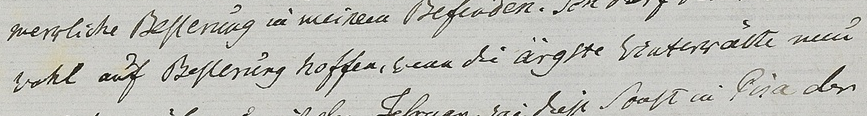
wohl auf Besserung hoffen, wenn die ärgste Winterkälte nun
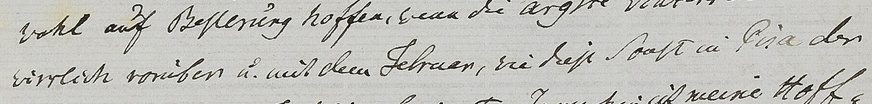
wirklich vorüber u. mit dem Februar, wie diess sooft in Pisa der
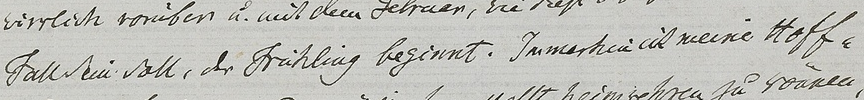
Fall sein soll, der Frühling beginnt. Immerhin ist meine Hoff-
